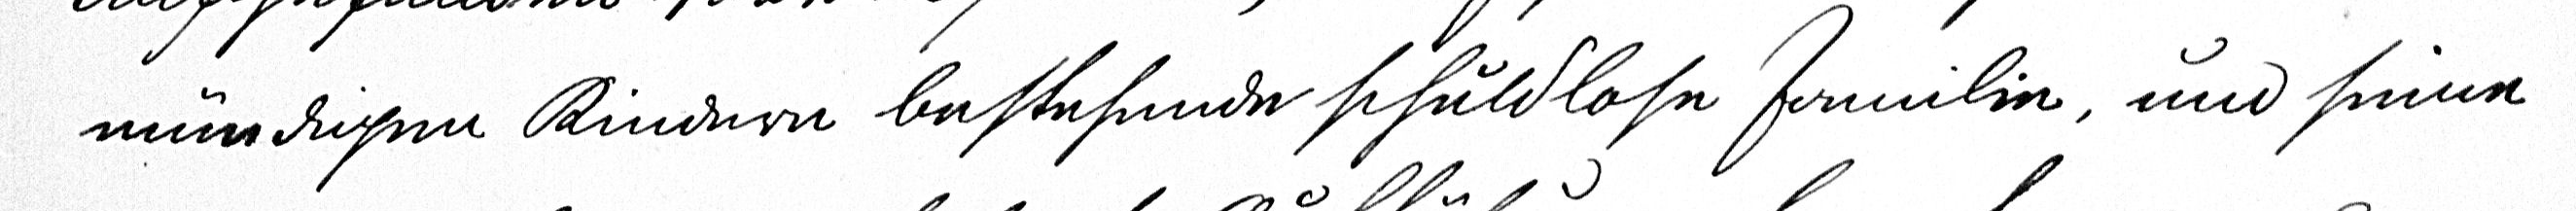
mündigen Kindern bestehende schuldlose Familie, und seine
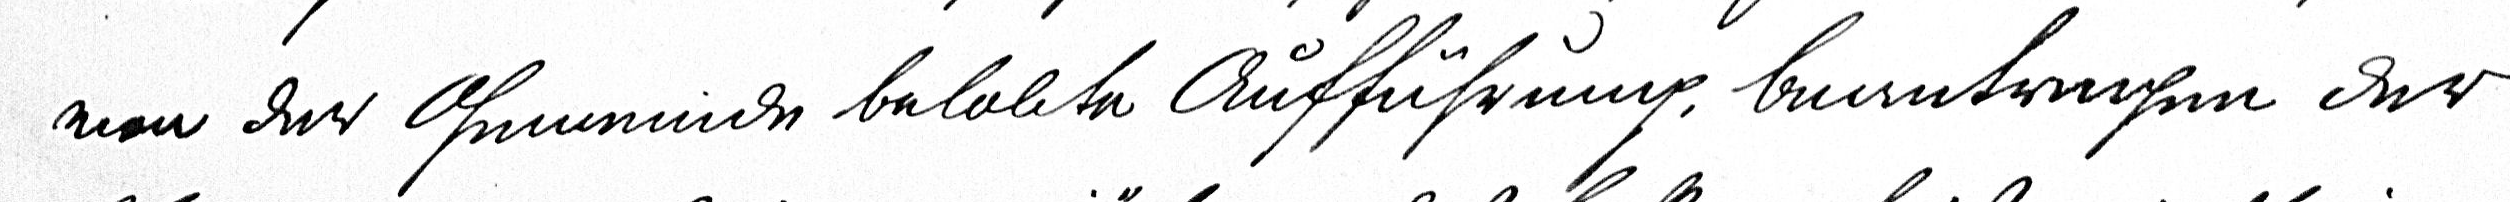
von der Gemeinde belobte Aufführung, beantragen der
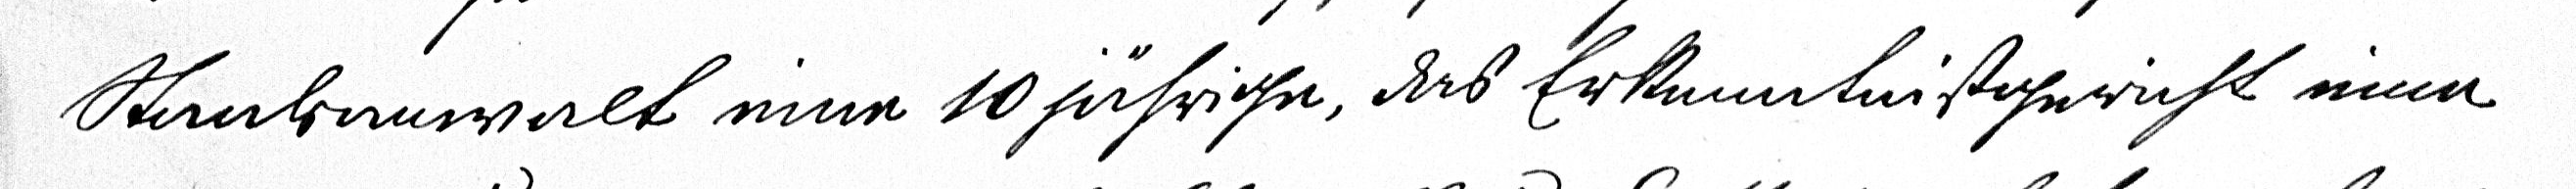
Staatsanwalt eine 10 jährige, das Erkenntnißgericht eine
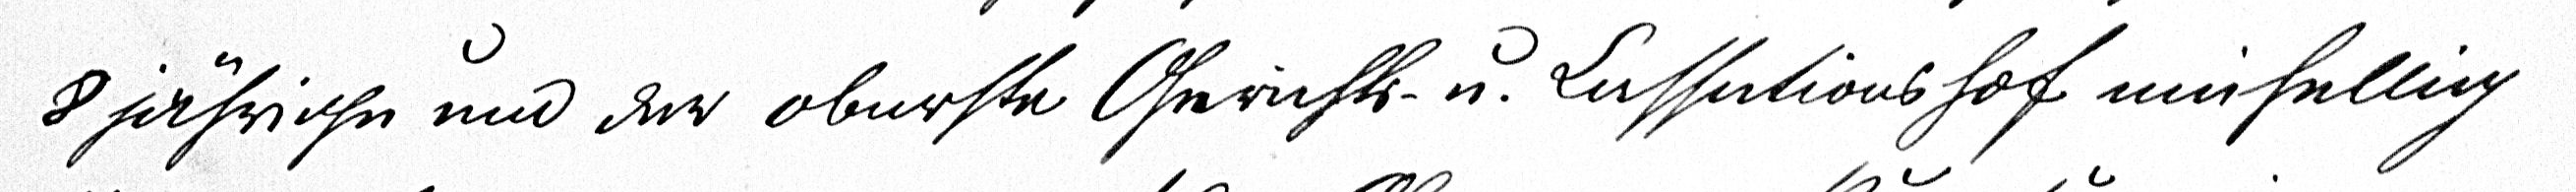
8 jährige und der oberste Gerichts- u. Cassationshof einfellig
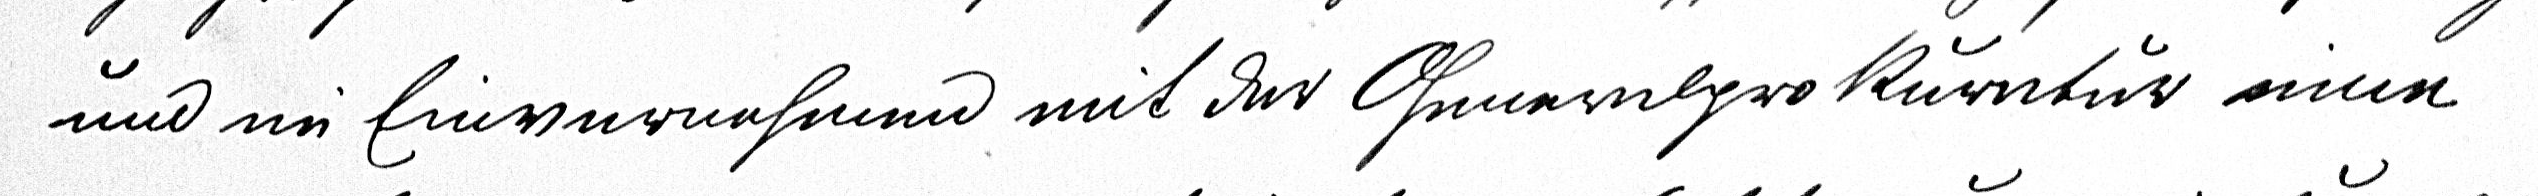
und im Einvernehmen mit der Generalprokuratur eine
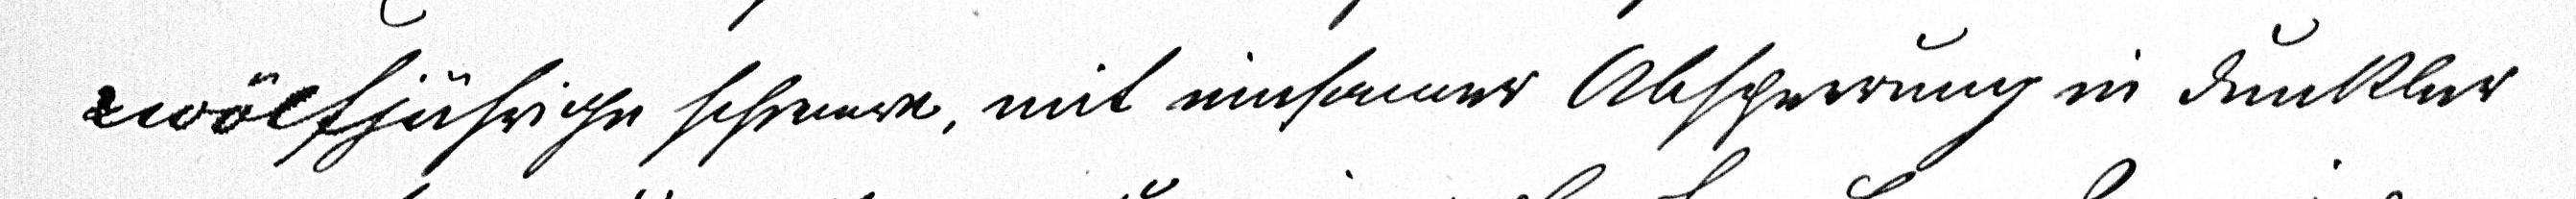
zwölfjährige schwere, mit einsamer Absperrung in dunkler
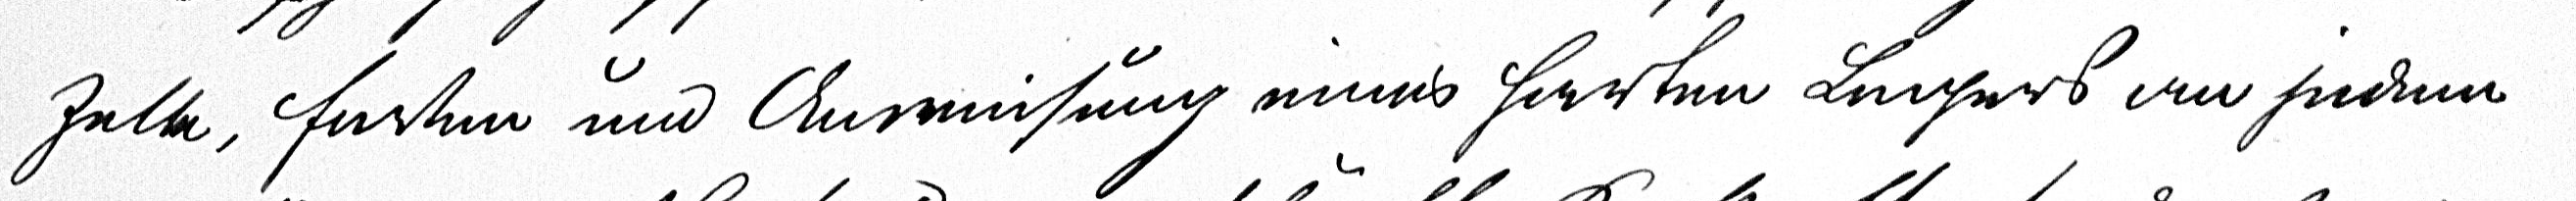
Zelle, Fasten und Anweisung eines harten Legers an jedem
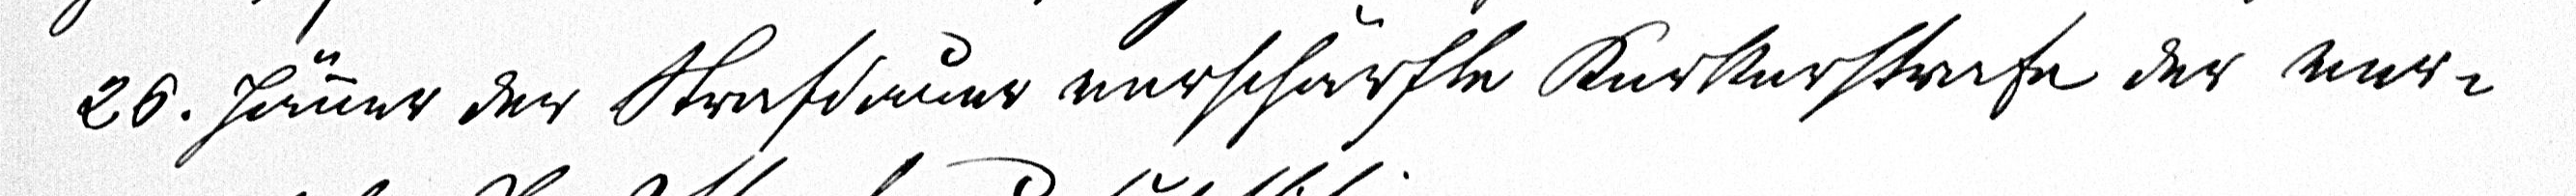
26. Jänner der Strafdauer verschärfte Kerkerstrafe der ver¬
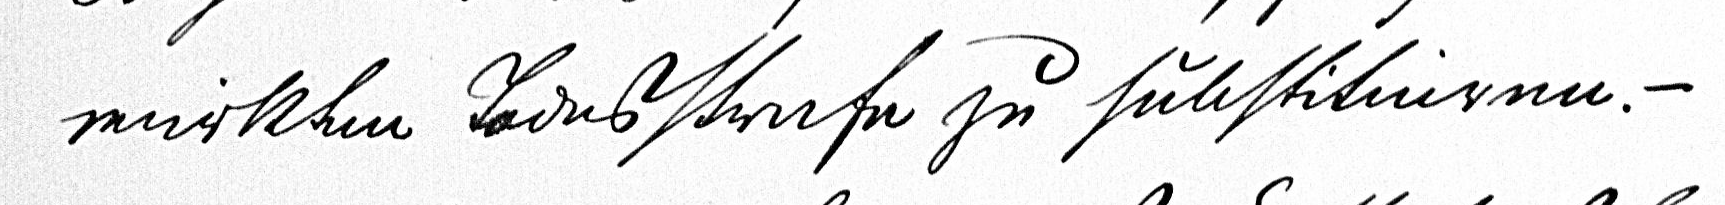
wirkten Todesstrafe zu substituiren.-
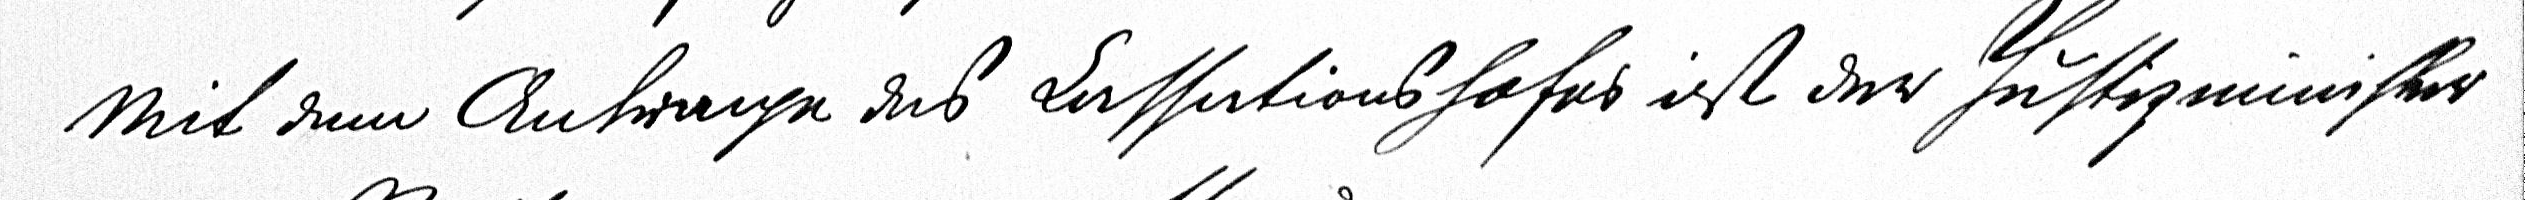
Mit dem Antrage des Cassationshofes ist der Justizminister
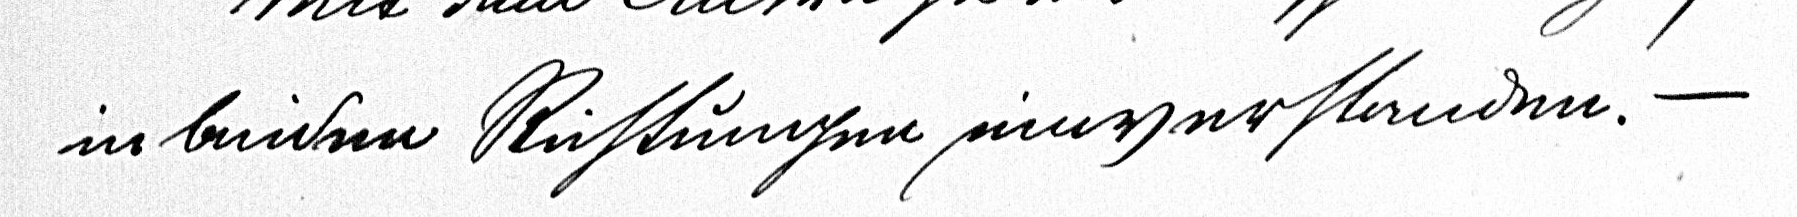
in beiden Richtungen einverstanden.—
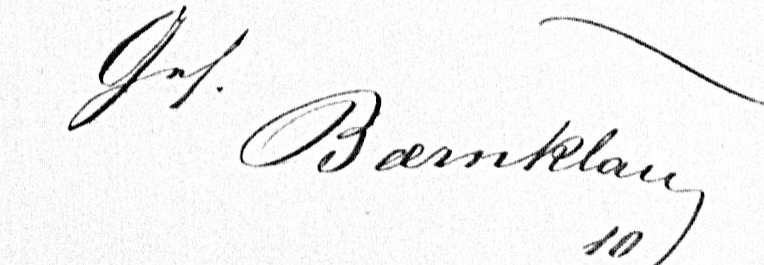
Ges. Barnklau
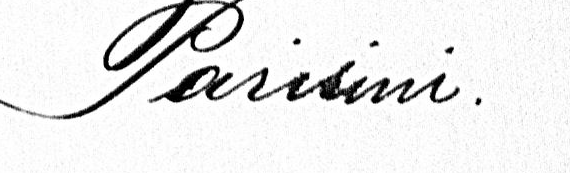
Parixxini.
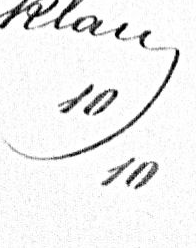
10/10
